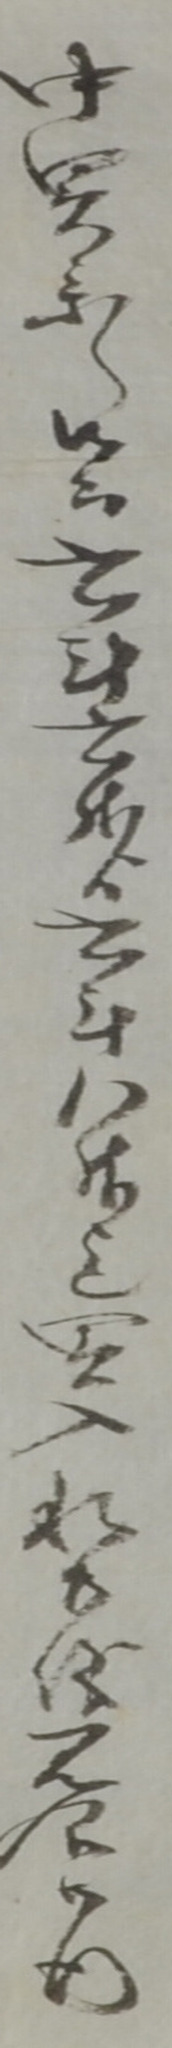中買参候而六斗六升ゟ六斗八升迄買入私共儀見合候内
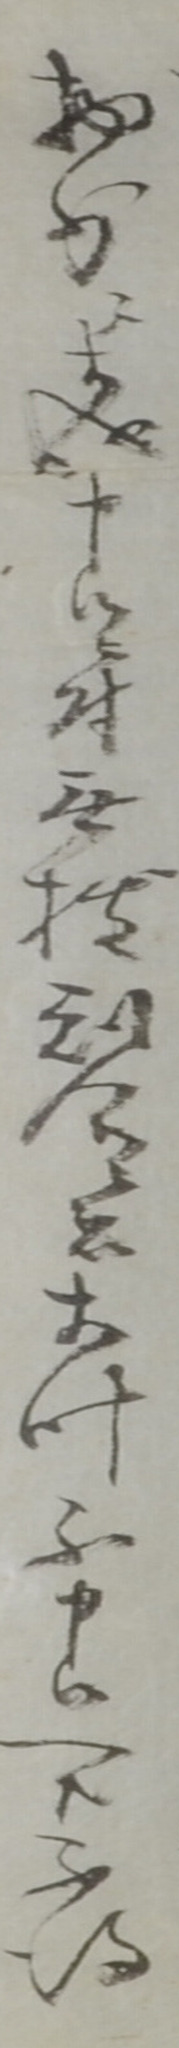物少と相成申候ニ付無拠刻合ニ者相叶不申候へ共不得

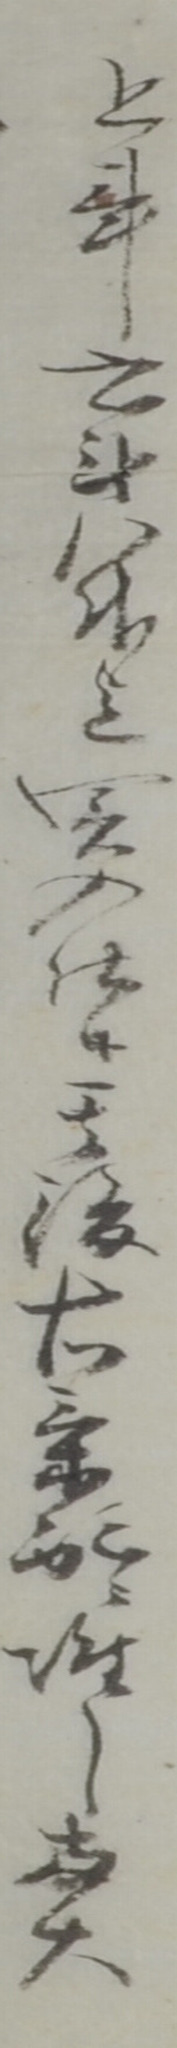止事六斗八升迄買入仕候其後右気配ニ准し両大
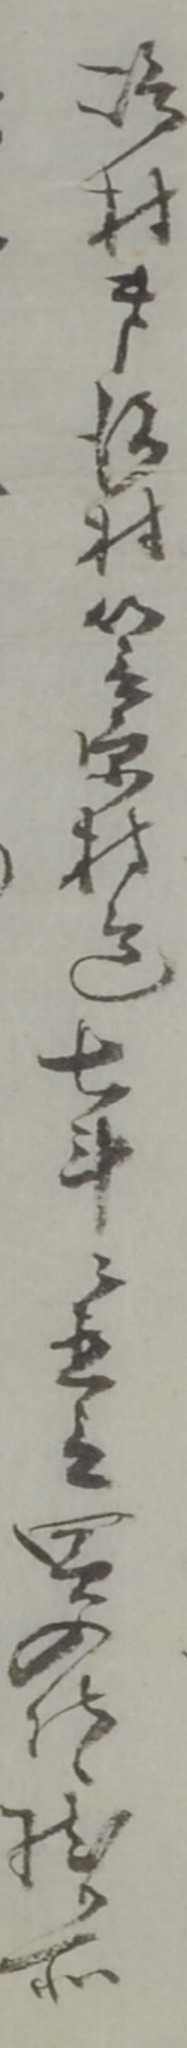嶋村芦沢村笠原村辺七斗ニ直立買入仕候然ル所
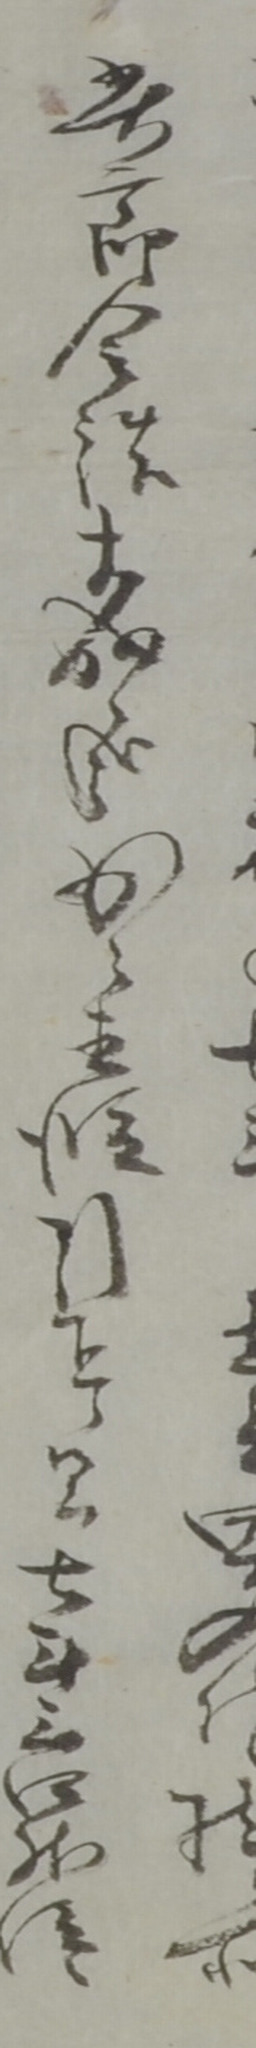此節金詰相成候哉少々直段引下ケ候而七斗三四升位ニ
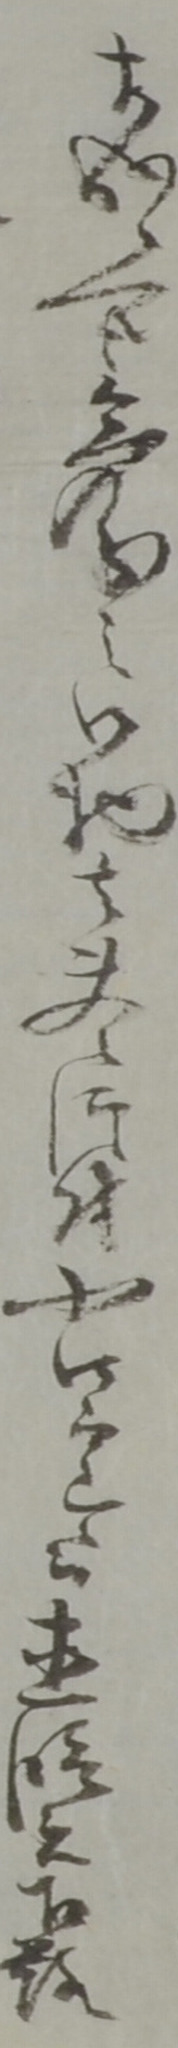相成候へ共多分之口物は夫々片付小口而已ニ而直段は下落
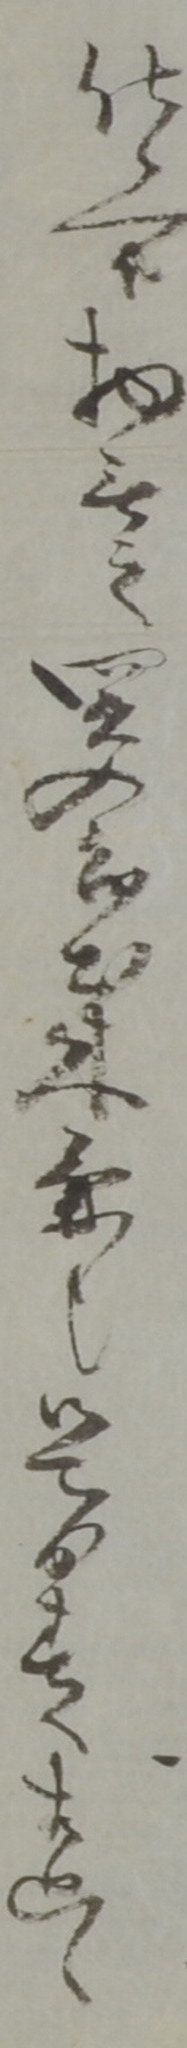仕候へ共物無之買入商出来兼申候是ゟ春へ相廻候
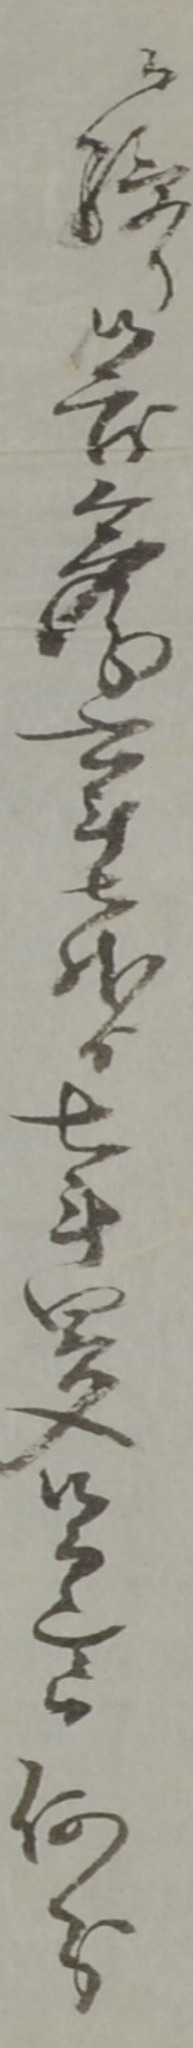而障り候も多分六斗七升ゟ七斗買入候而已ニ而何分
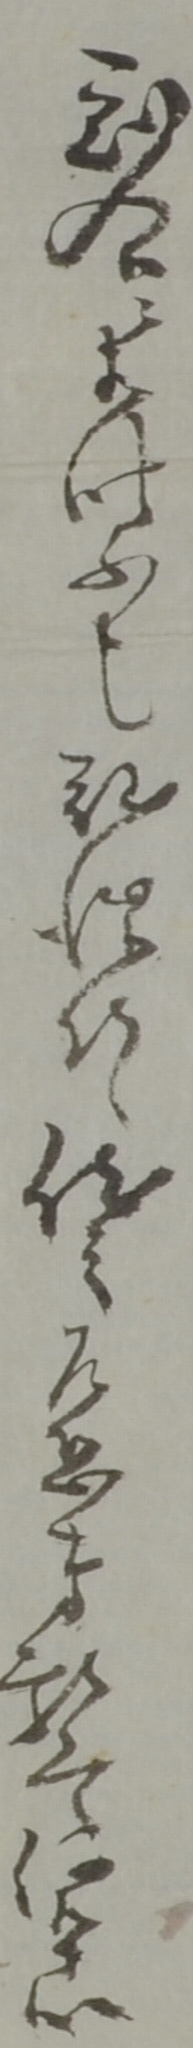刻合ニ相叶不申難渋仕候依之乍恐奉願上候何卒以
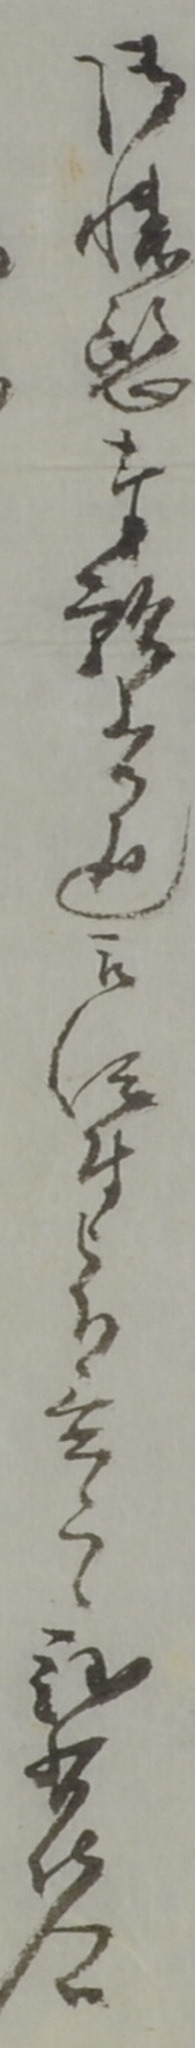御憐愍奉願上候通被仰付被下置候ハヽ難有仕合
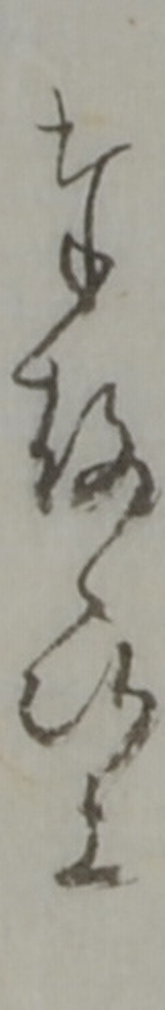奉存候以上
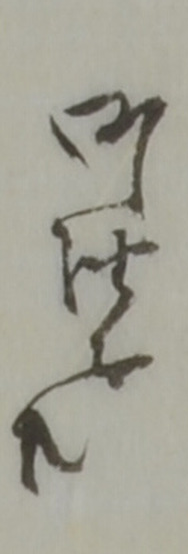奉存候以上
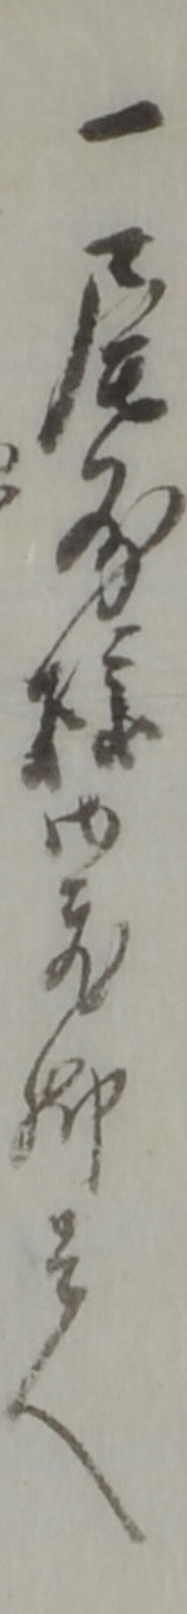一尾州様御飛脚壱人
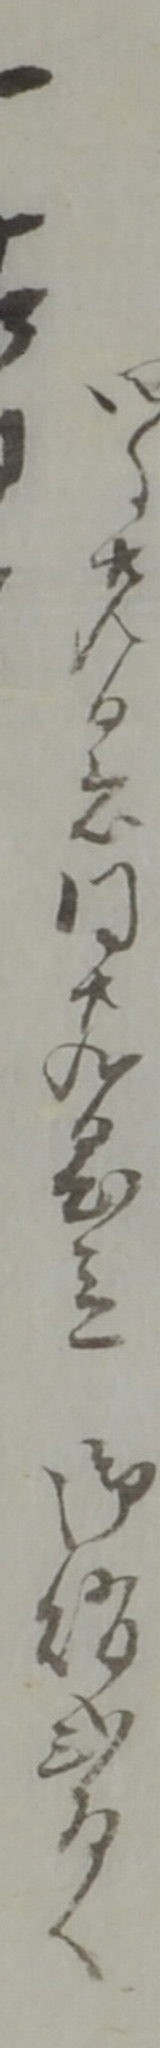四月廿八日着同廿九日出立御賄弐百文
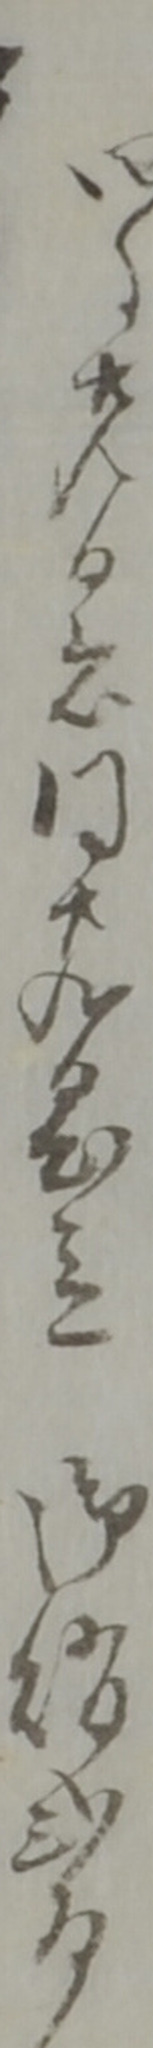四月廿八日着同廿九日出立御賄弐百文
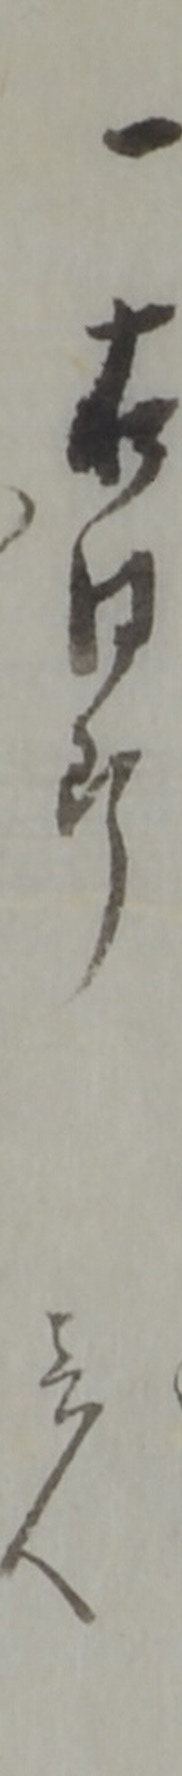一右同断壱人
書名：諸願書控簿
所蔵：伊那市立高遠町図書館・合同会社AMANE
